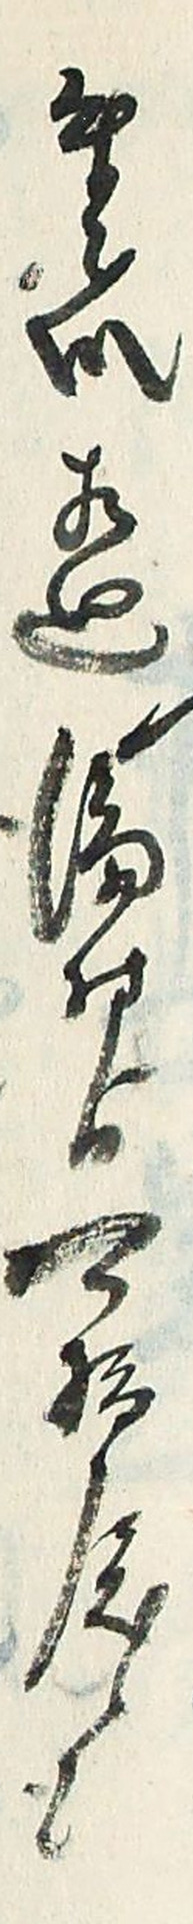付を以相廻済村ゟ可指戻候以上
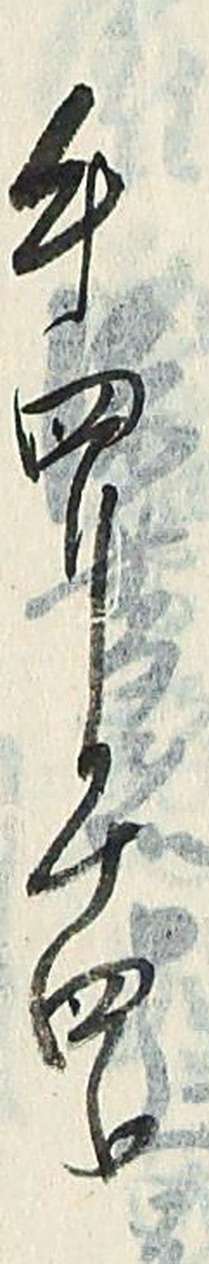午四月十四日
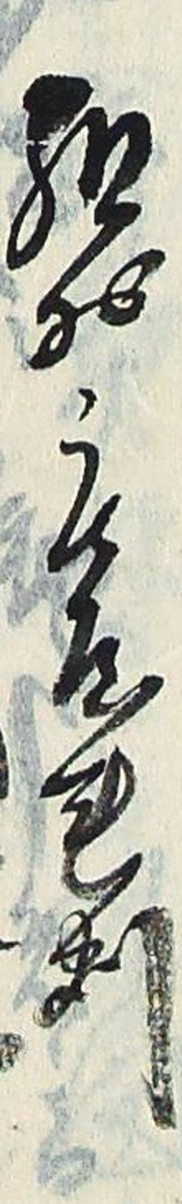組村庄屋連判
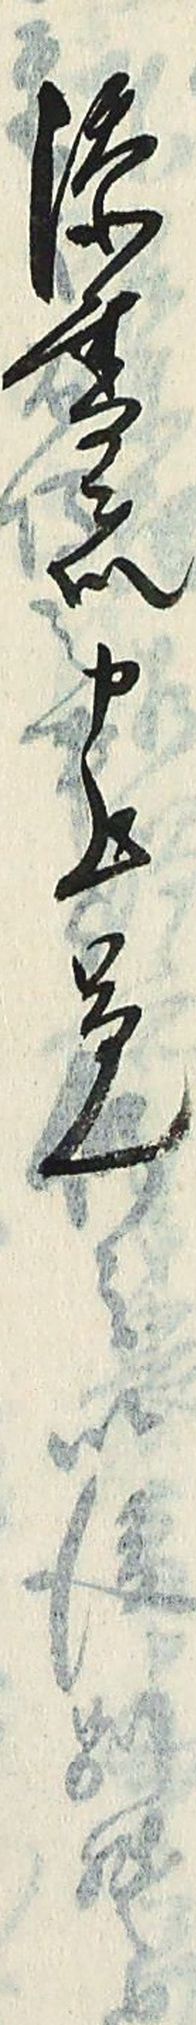添書を以申上覚
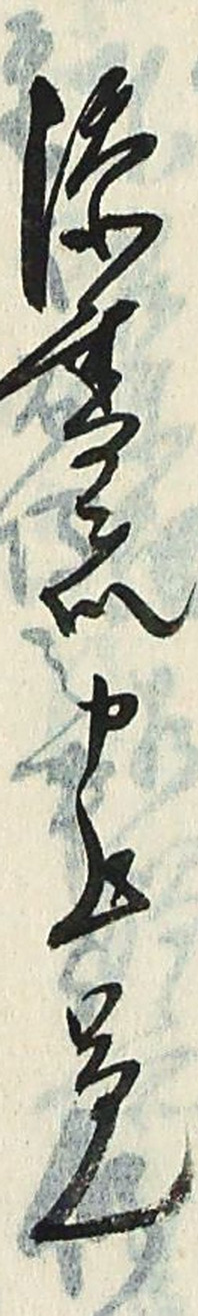添書を以申上覚
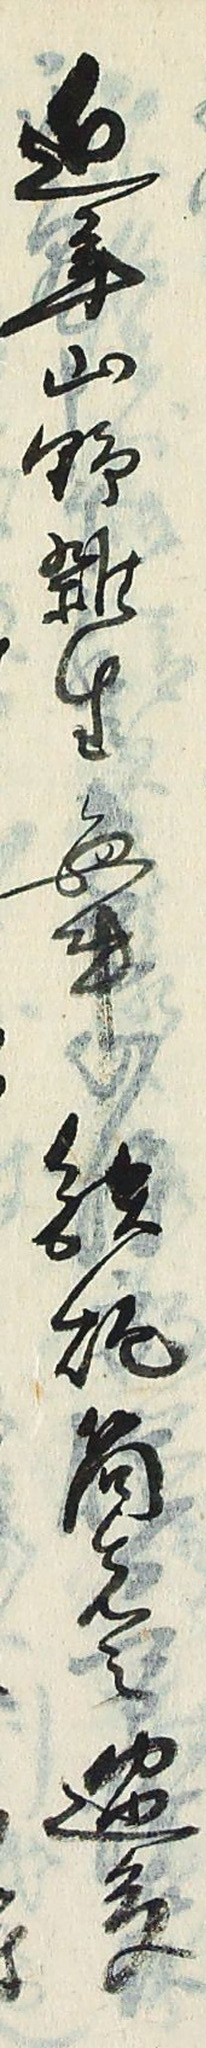近年山野雑生毎事鉄砲筒先之過多
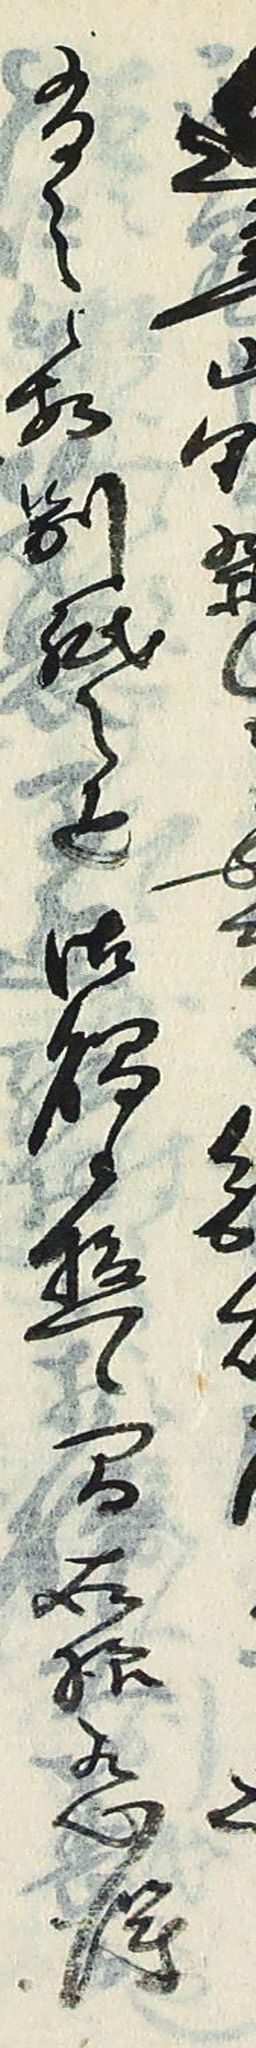有之候段別紙之通御触被遊候間右様相心得
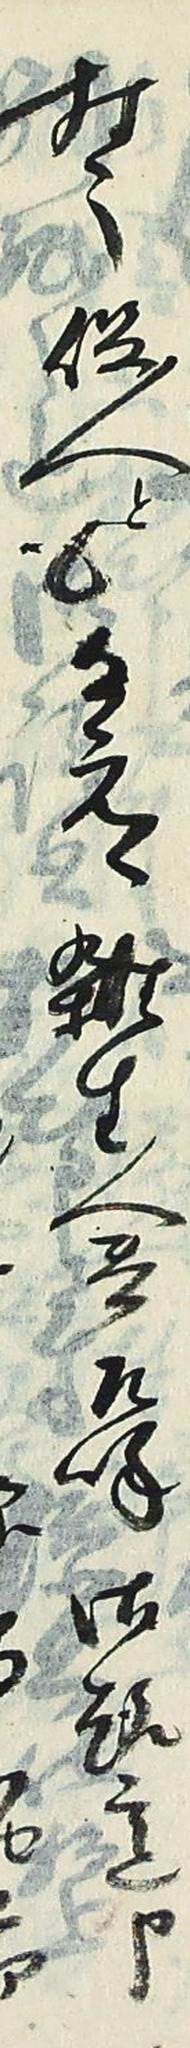村々役人とも手元へ雑生人共召呼御趣意申
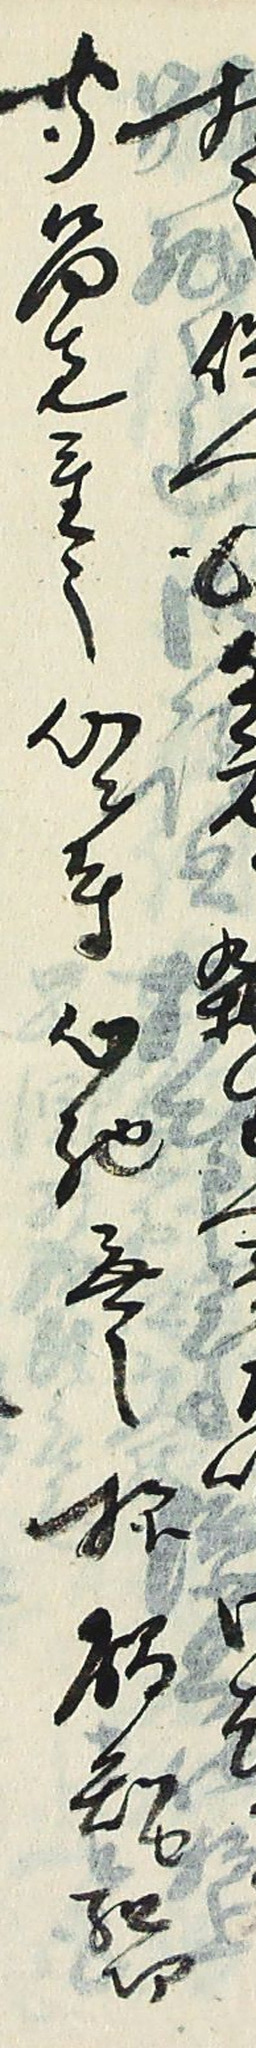聞筒先重々心に付心弛無之様触知せ組切
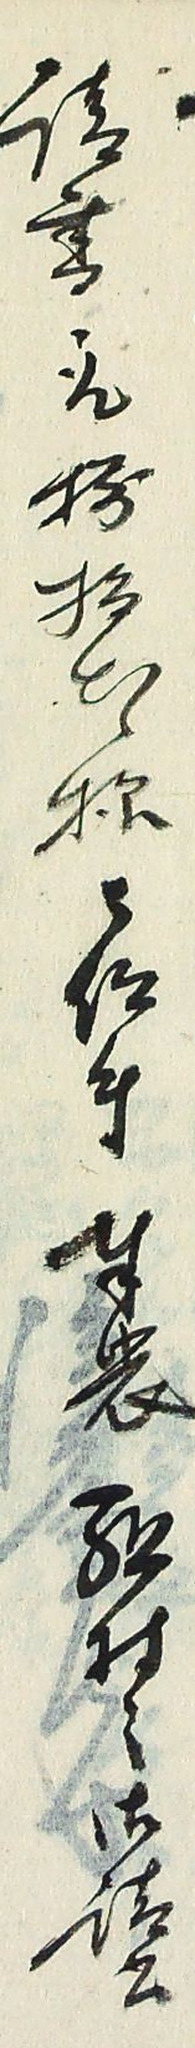請書取揃指出候様仰付被奉畏組村々御請書
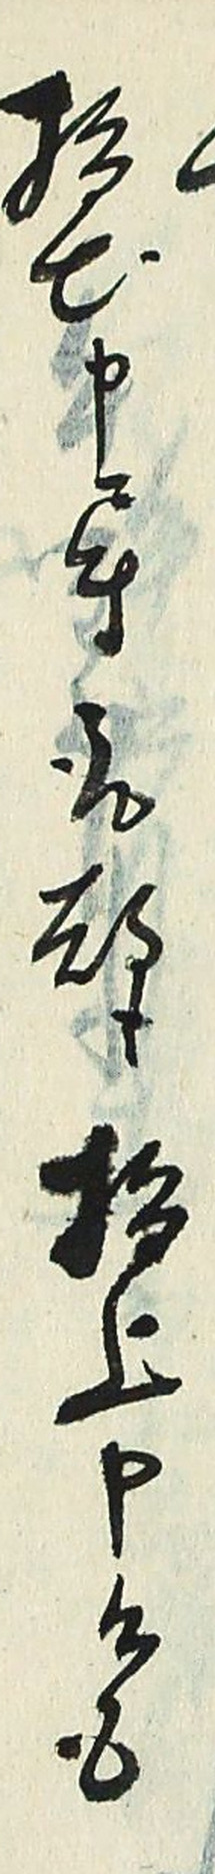指出申に付取都め指上申候以上
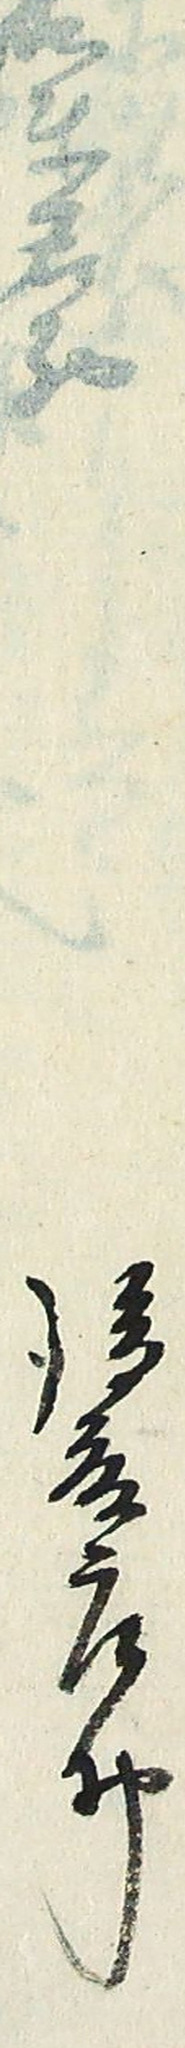後藤庄助
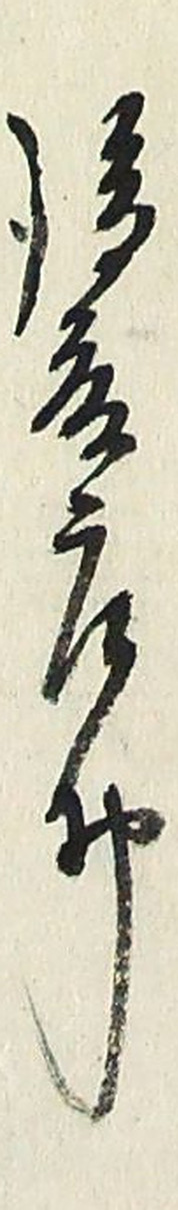後藤庄助
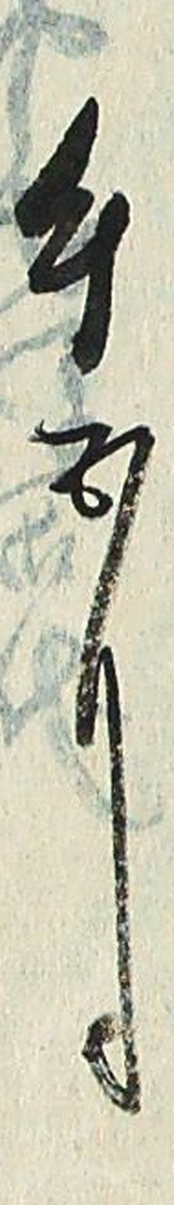午五月
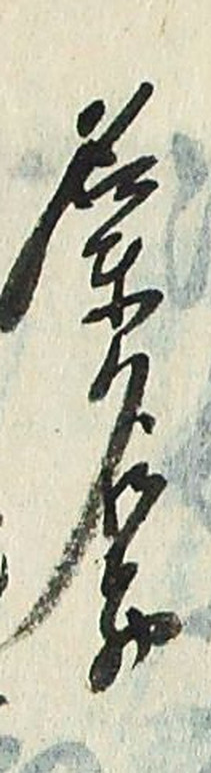名東名西
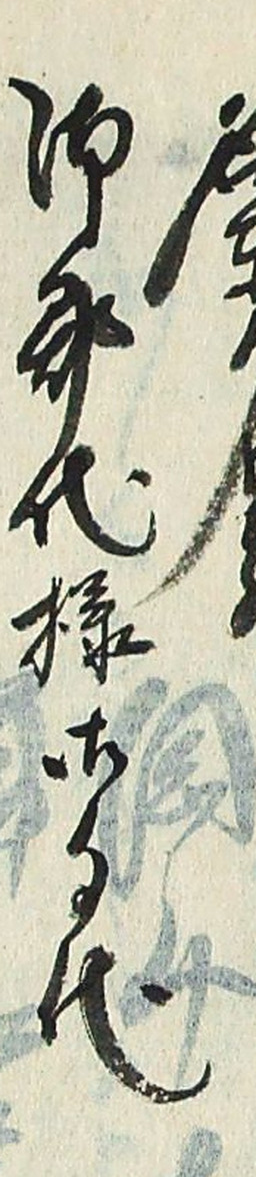御郡代様御手代
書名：諸御用御□受書控
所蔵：鳴門教育大学 Naruto University of Education
